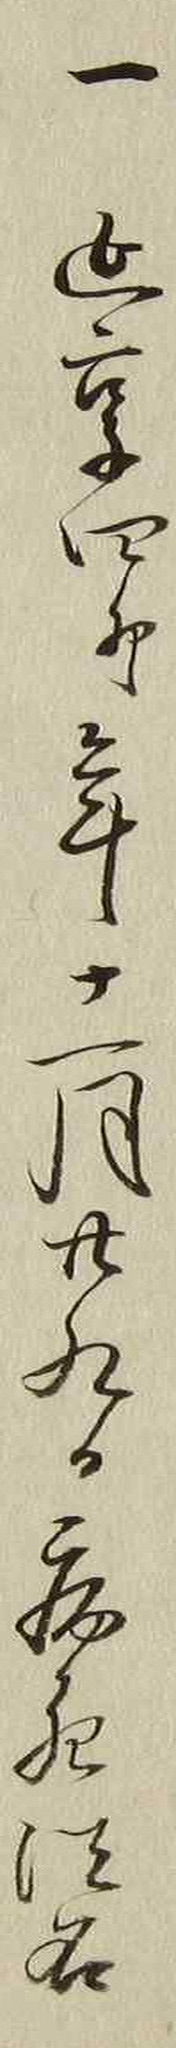一延享四丑年十一月廿九日病死法名
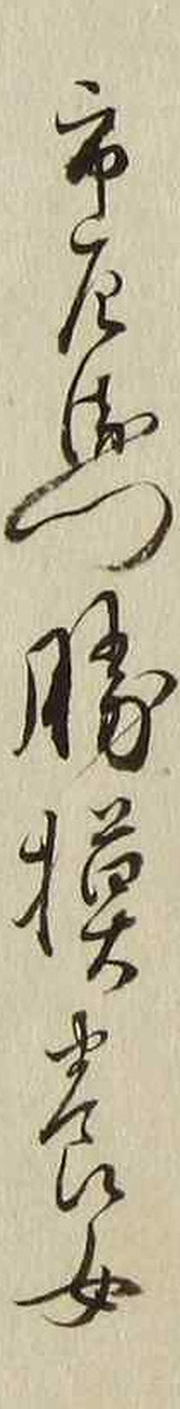女市左衛門勝模養女
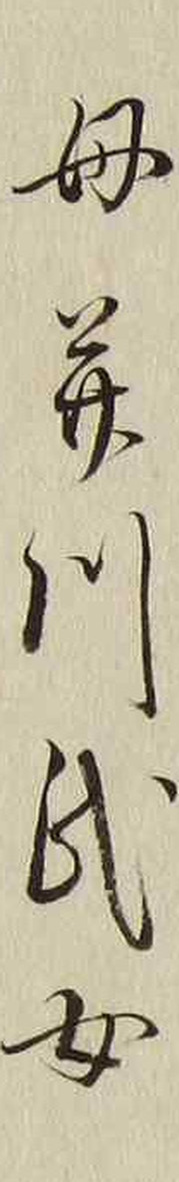母并川氏女

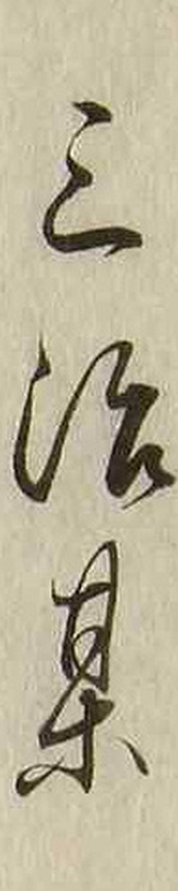三治某
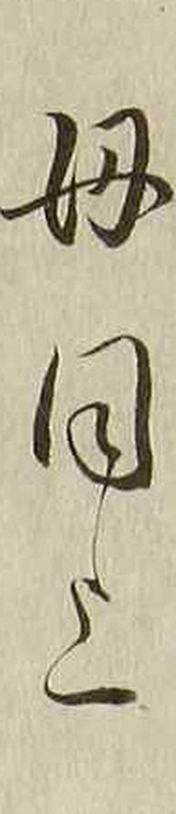母同上
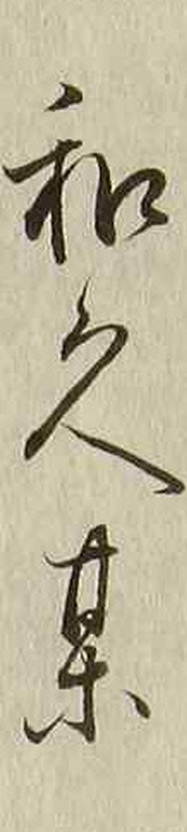和久某
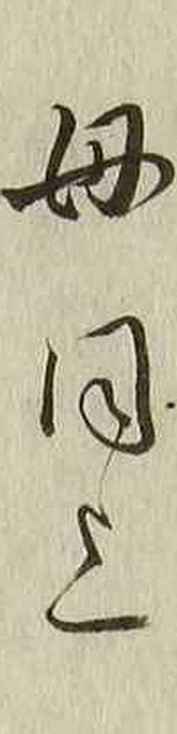母同上
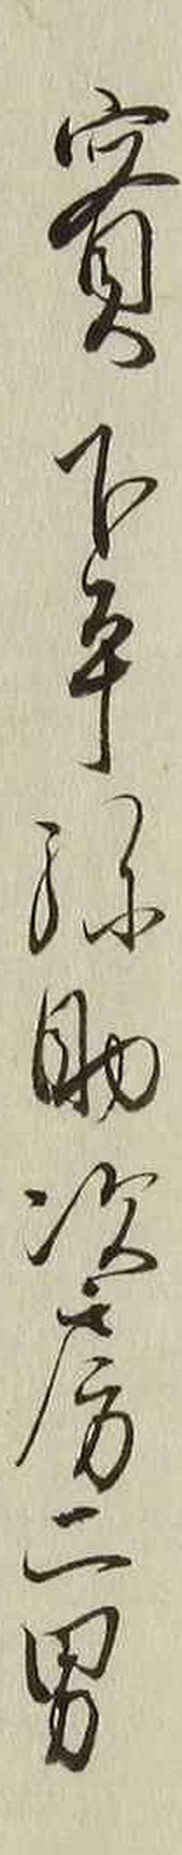実下平弥助次房二男
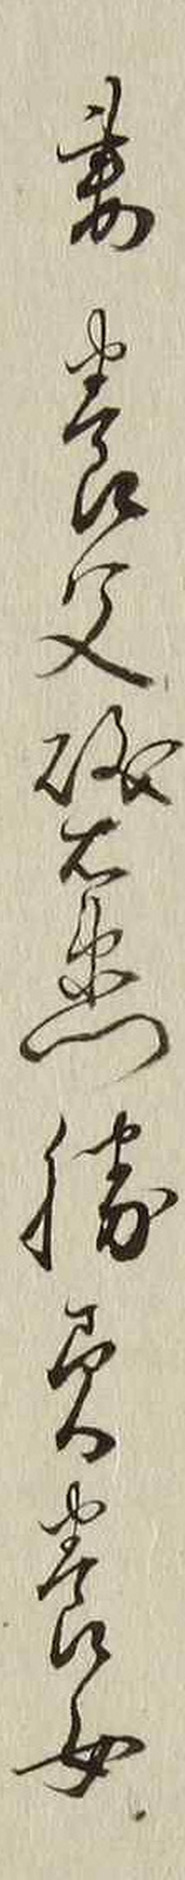妻養父磯右衛門勝美養女
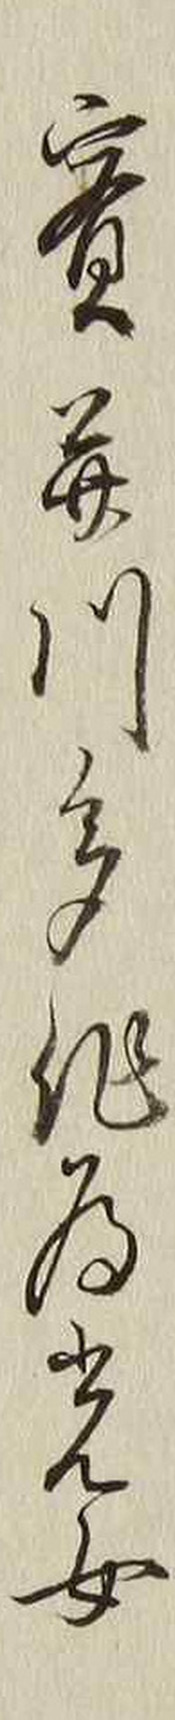実并川多作為光女
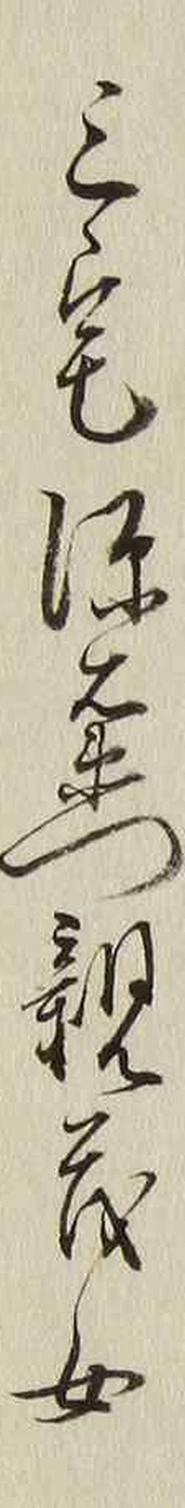三宅源右衛門親茂女
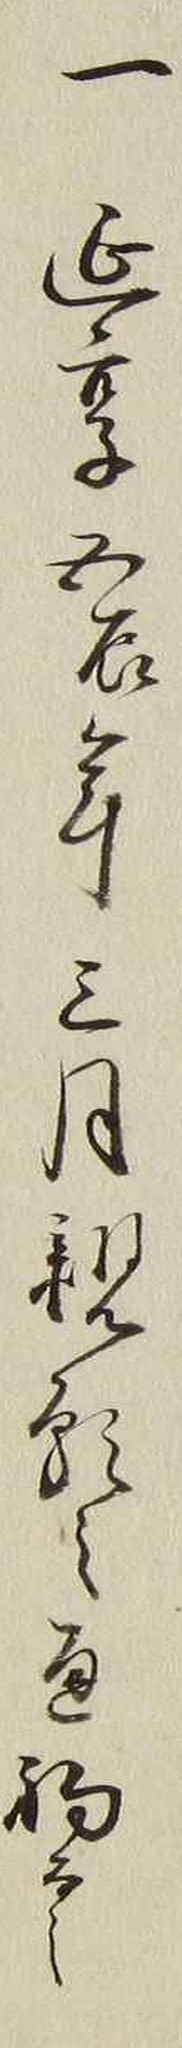一延享五辰年三月親願い之通初めて
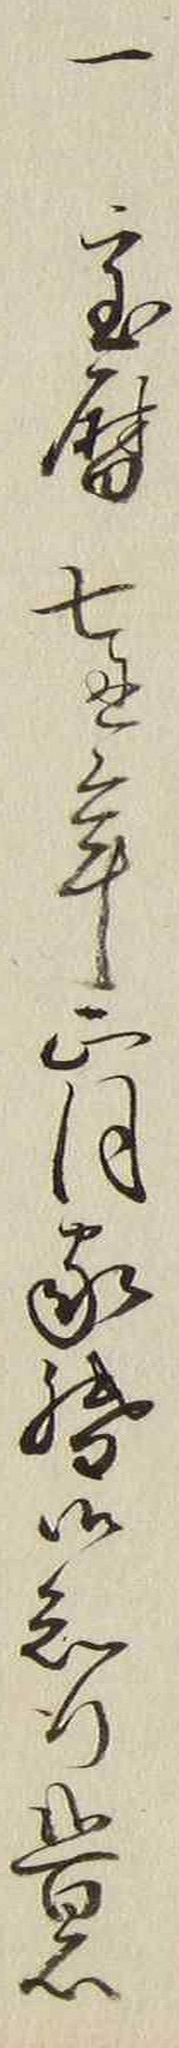一宝暦七丑年正月家督御知行弐百石

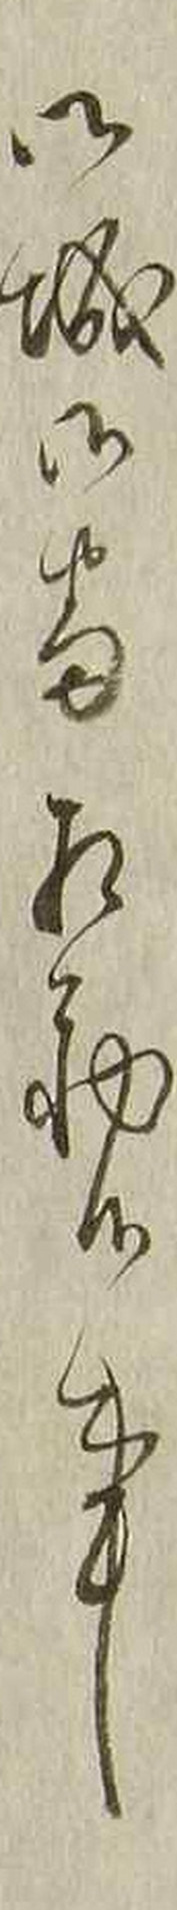御城御番相勤め候事
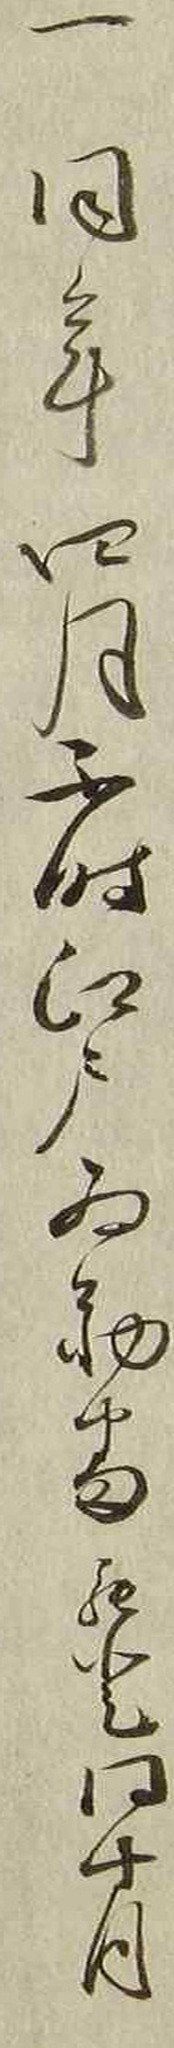一同年四月不時江戸勤番之為罷り登り同十月
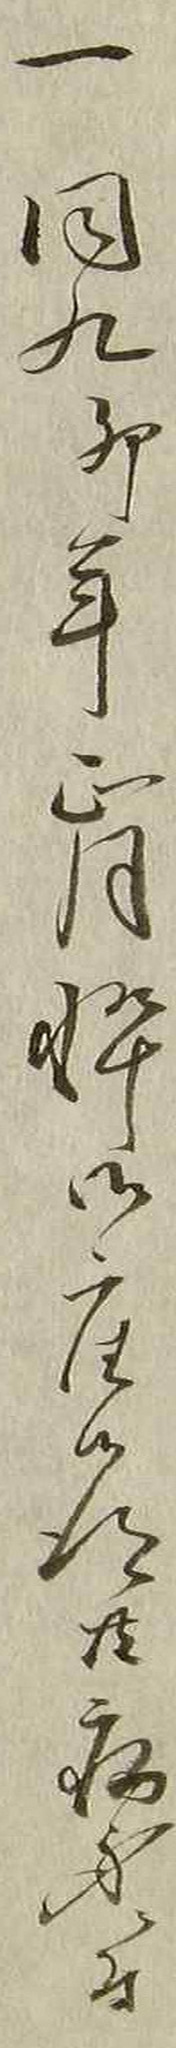一同九卯年正月倅御雇い候得共病身ニ付き
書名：諸士系譜　巻之20　い之部20
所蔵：会津若松市立会津図書館
